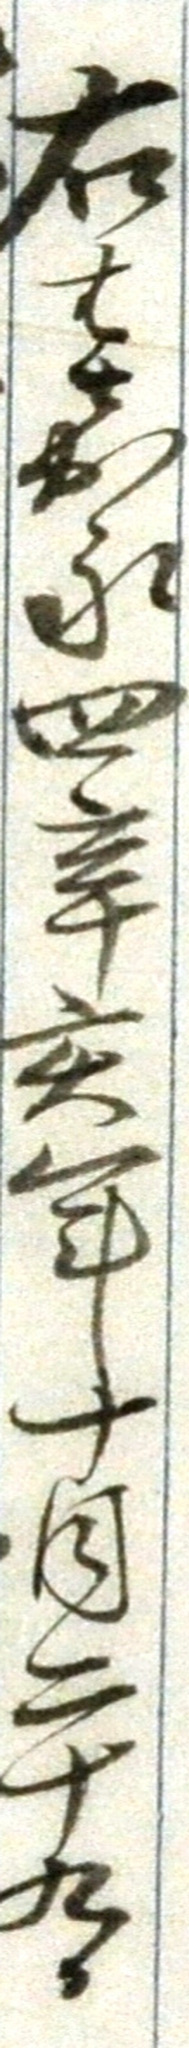右者嘉永四辛亥年十月二十九日
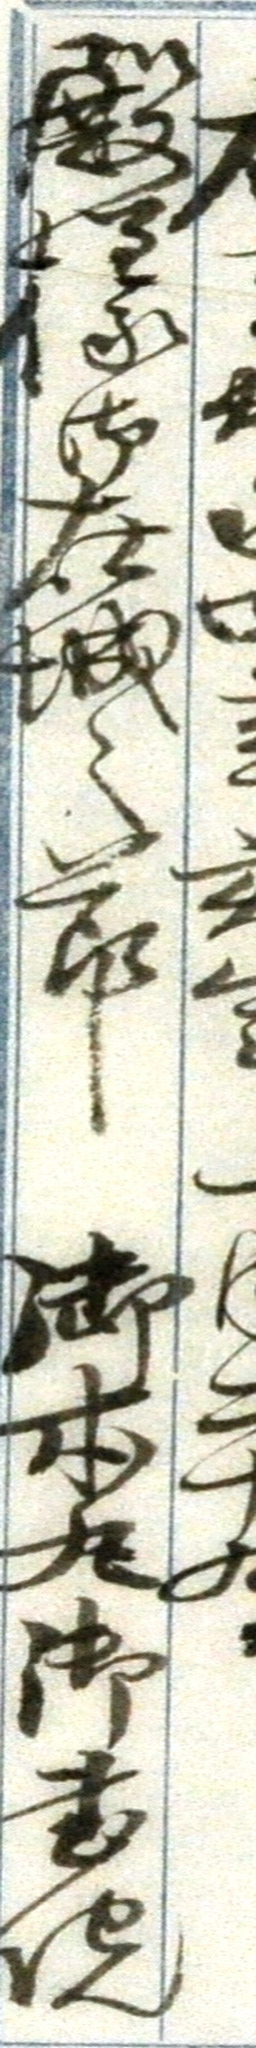殿様御在城之節御本丸御書院
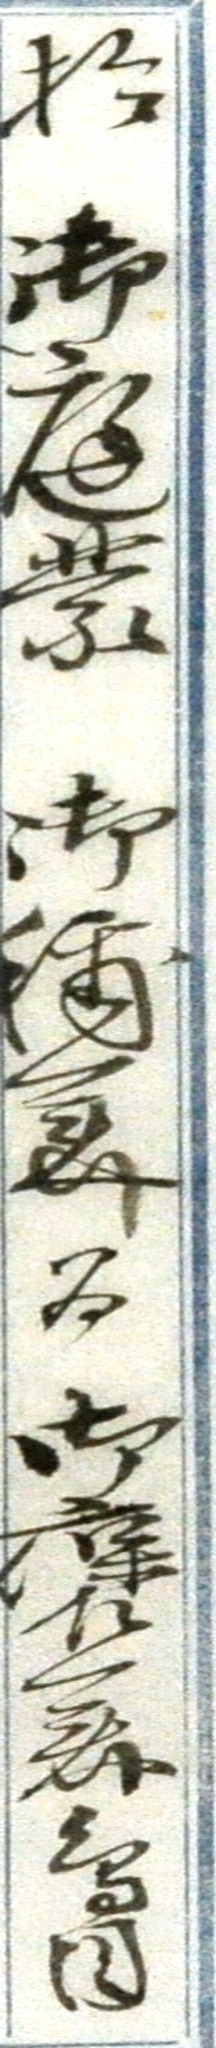於御庭蒙御称美為御褒美鳥目
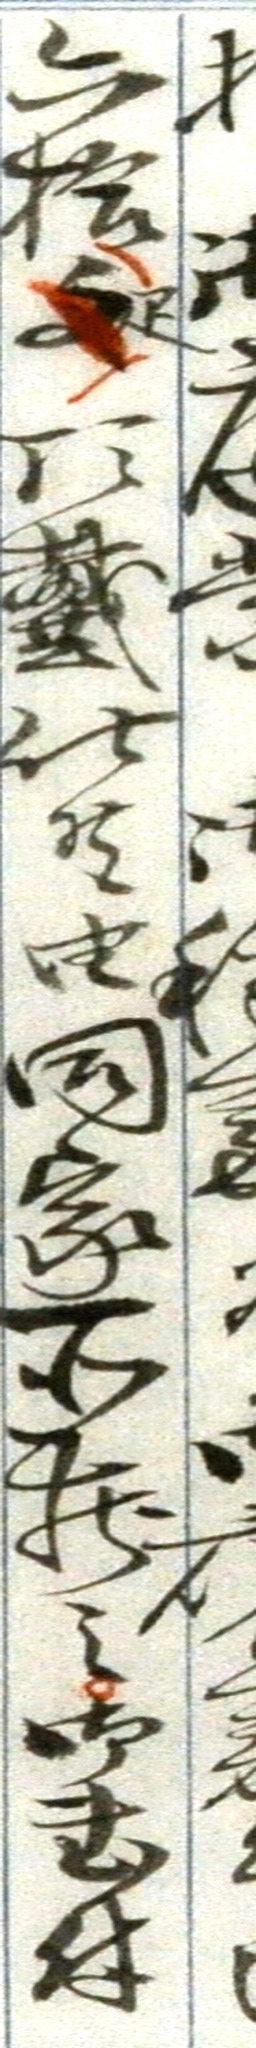令拾疋頂戴仕候由同家所蔵之御書付
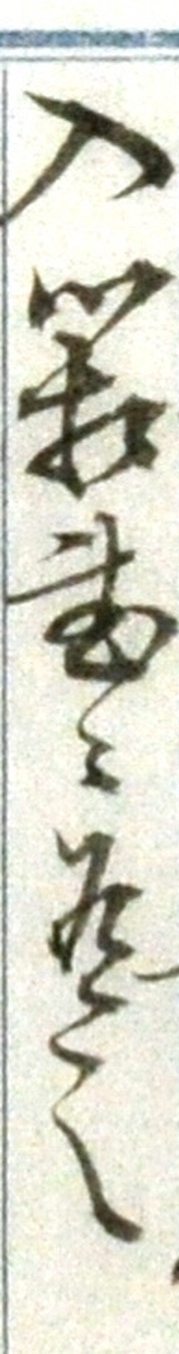入箱書ニ有之

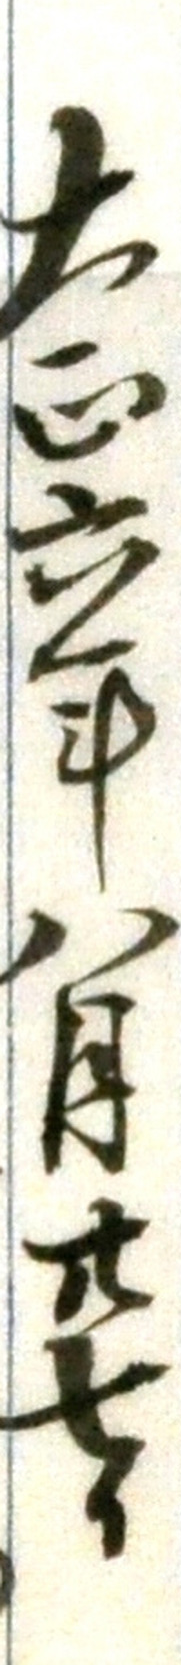大正六年八月廿七日
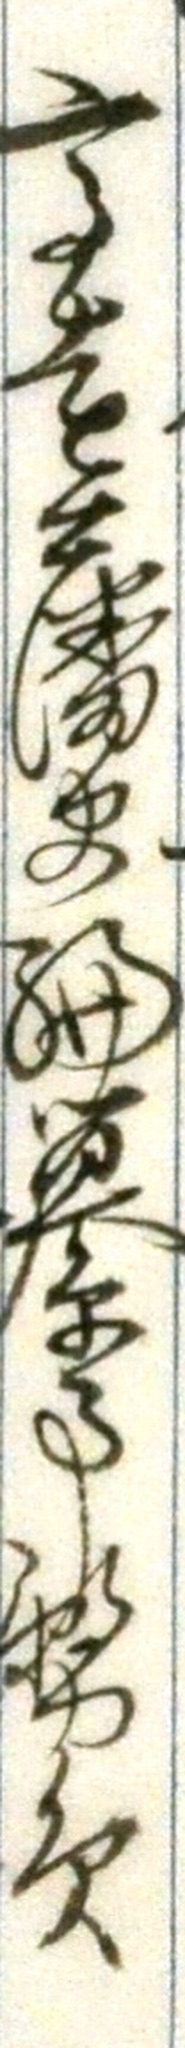高遠藩史編纂事務員
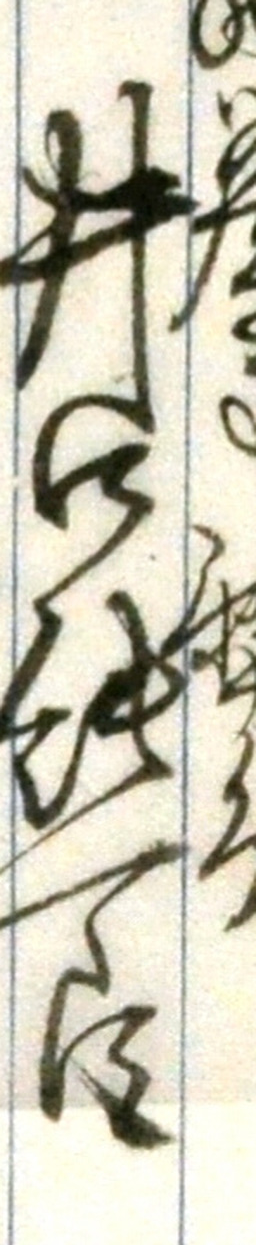井口純一郎
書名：御称美筋御書下
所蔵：伊那市立高遠町図書館・合同会社AMANE
